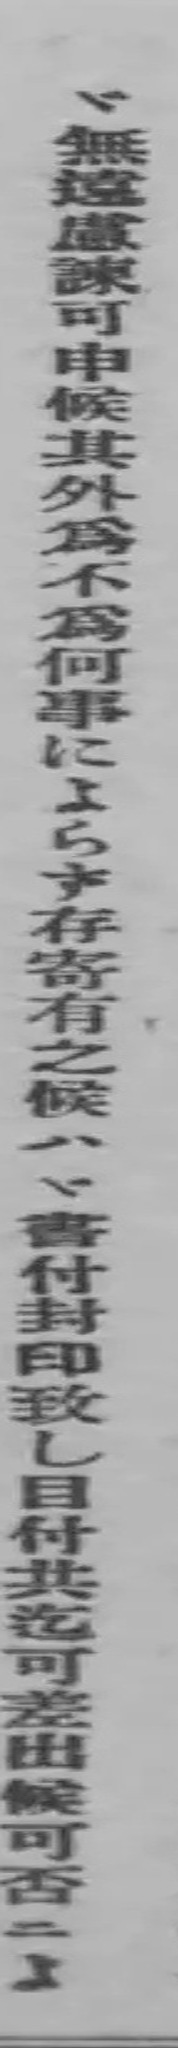ヾ無遠慮諫可申候其外為不為何事によらず存寄有之候ハヾ書付封印致し目付共迄差出候可否ニよ
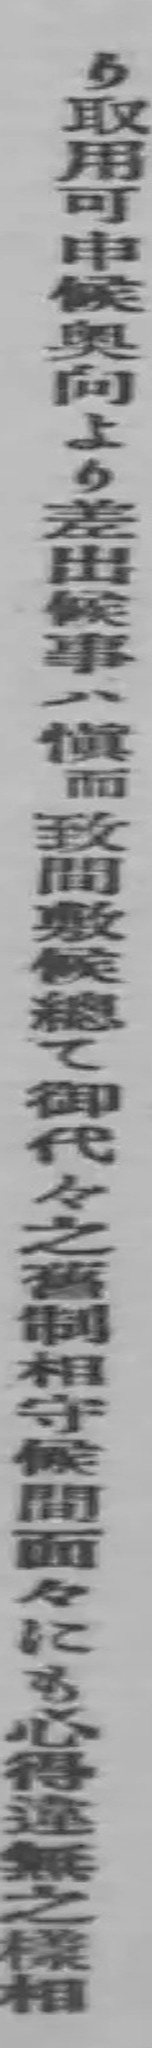り取用可申候奥向より差出候事ハ慎而致間敷候総て御代々之旧制相守候間面々にも心得違無之様相
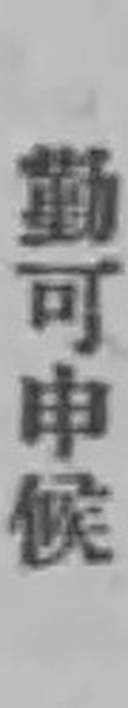勤可申候
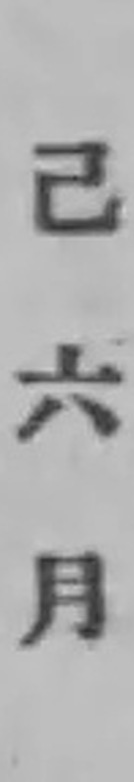己六月
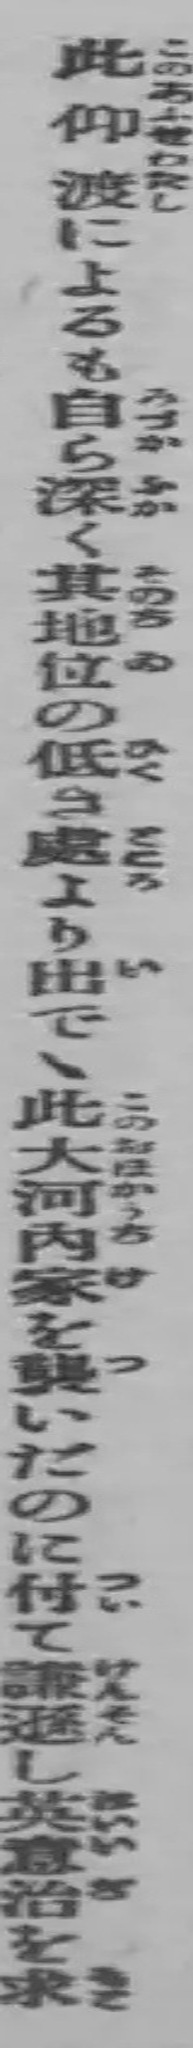此仰渡によるも自ら深く其地位の低き処より出でゝ此大河内家を襲いだのに付て謙遜し英意治を求
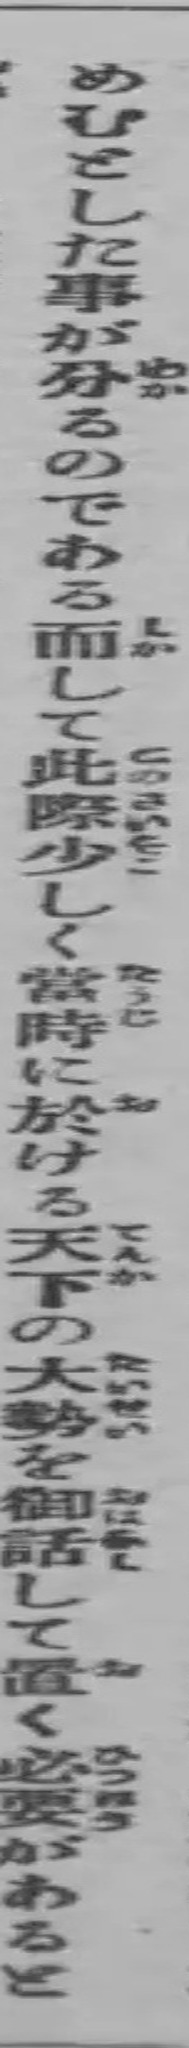めむとした事が分るのである而して此際少しく当時に於ける天下の大勢を御話して置く必要があると
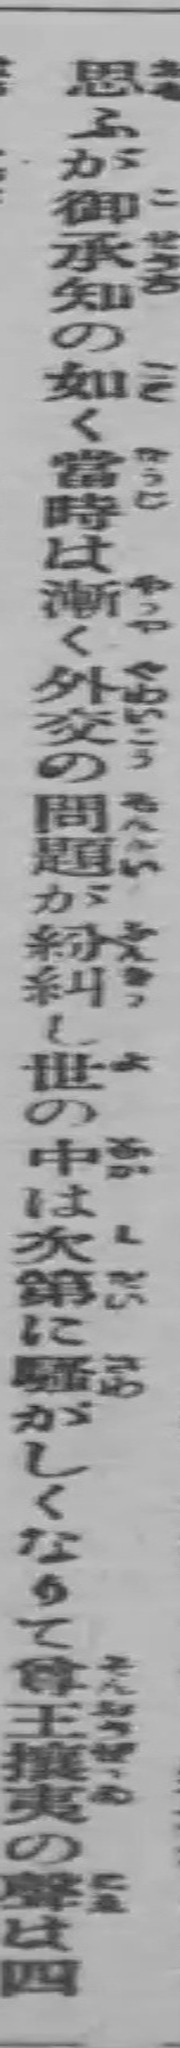思ふが御承知の如く当時は漸く外交の問題が紛糾し世の中は次第に騒がしくなりて尊王攘夷の声は四
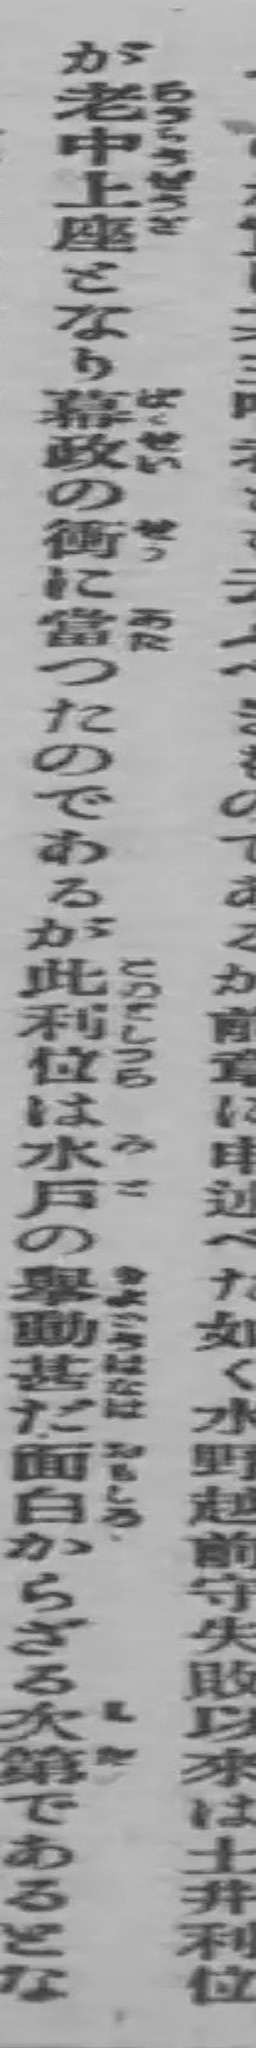が老中上座となり幕政の衝に当つたのであるが此利位は水戸の挙動甚だ面白からざる次第であるとな
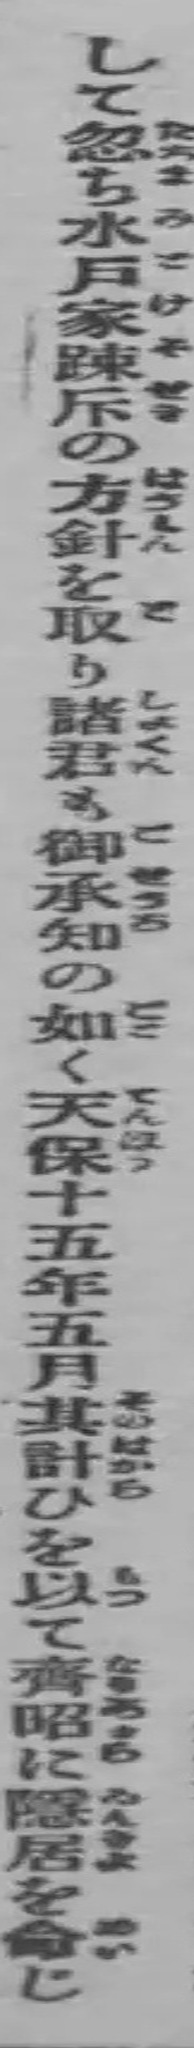して忽ち水戸家疎斥の方針を取り諸君も御承知の如く天保十五年五月其計ひを以て斉昭に隠居を命じ
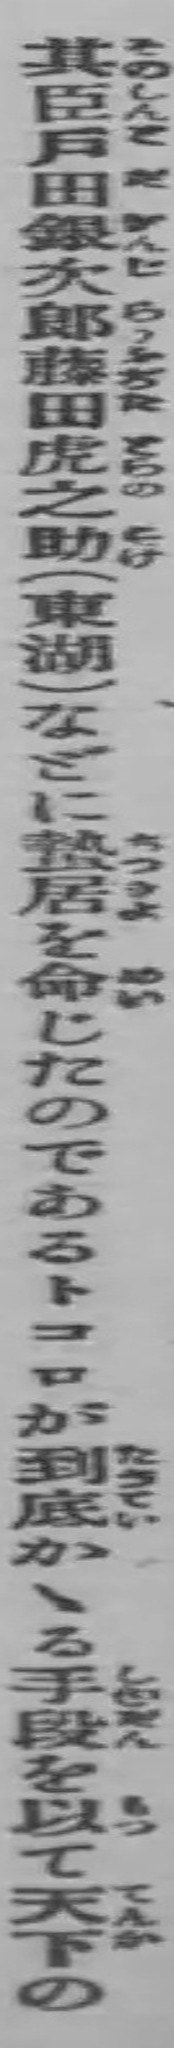其臣戸田銀次郎藤田虎之助(東湖)などに蟄居を命じたのであるトコロが到底かゝる手段を以て天下の
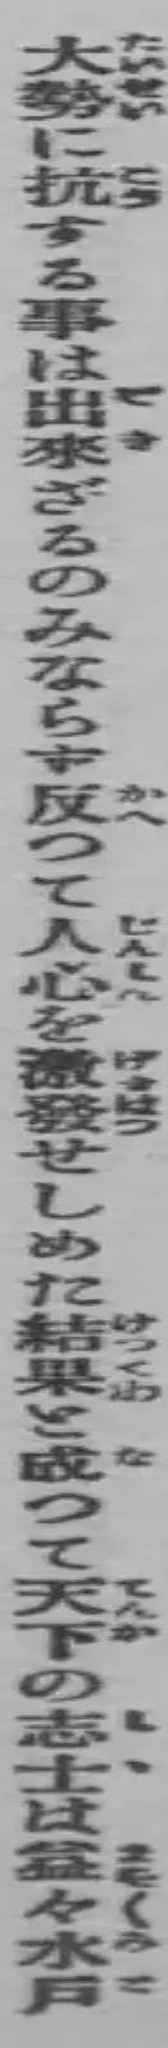大勢に抗する事は出来ざるのみならず反つて人心を激発せしめた結果と成つて天下の志士は益々水戸
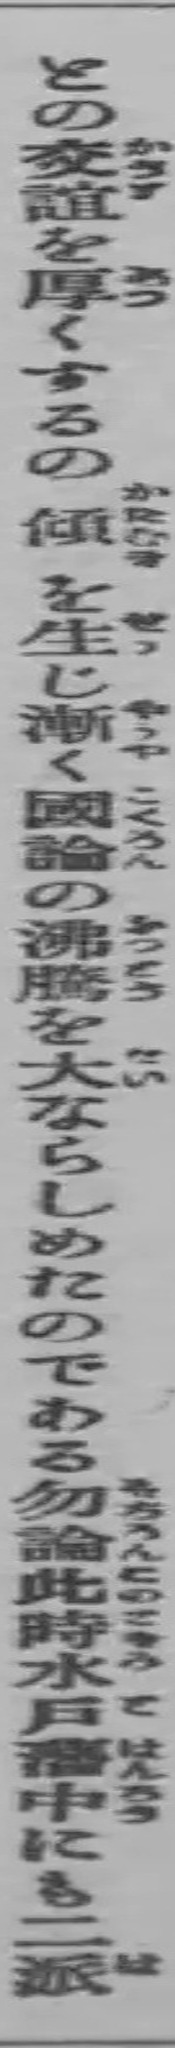との交誼を厚くするの傾を生じ漸く国論の沸騰を大ならしめたのである勿論此時水戸藩中にも二派
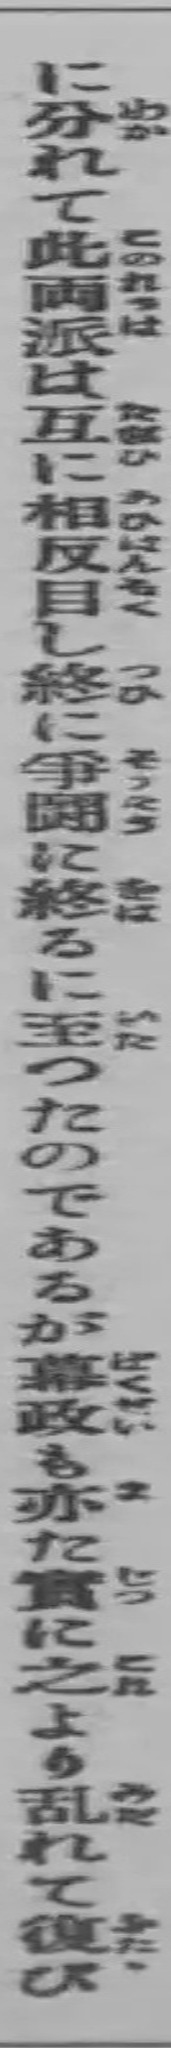に分れて此両派は互に相反目し終に争闘に終るに至つたのであるが幕政も亦た実に之より乱れて復び
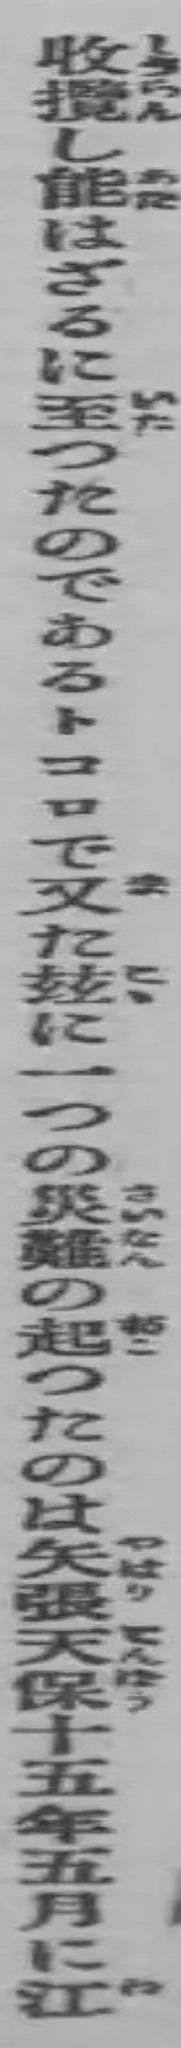収攬し能はざるに至つたのであるトコロで又た茲に一つの災難の起つたのは矢張天保十五年五月に江
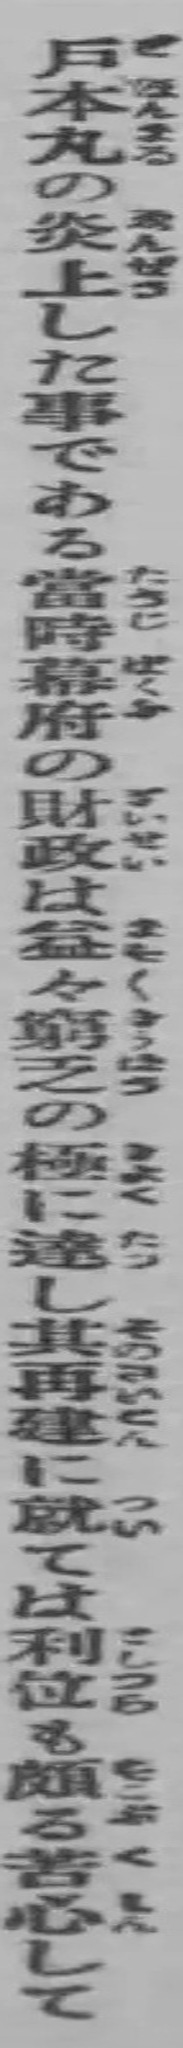戸本丸の炎上した事である当時幕府の財政は益々窮乏の極に達し其再建に就ては利位も頗る苦心して
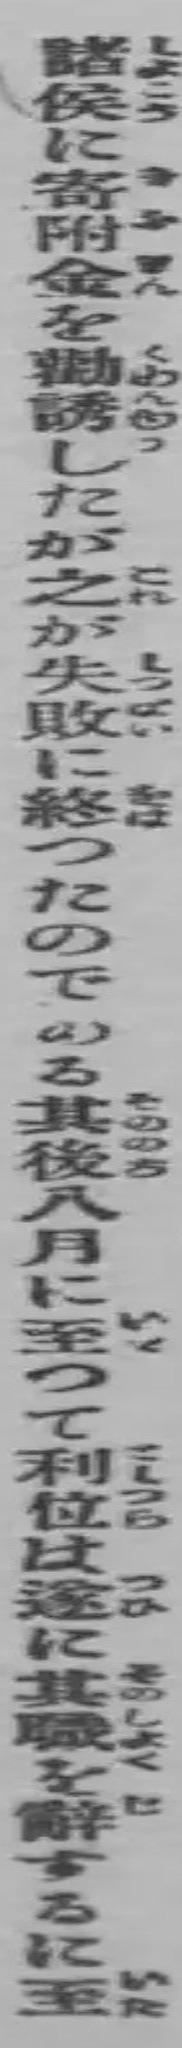諸侯に寄附金を勧誘したが之が失敗に終つたのである其後八月に至つて利位は遂に其職を辞するに至
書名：豊橋市史談
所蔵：国立国会図書館 National Diet Library, JAPAN
